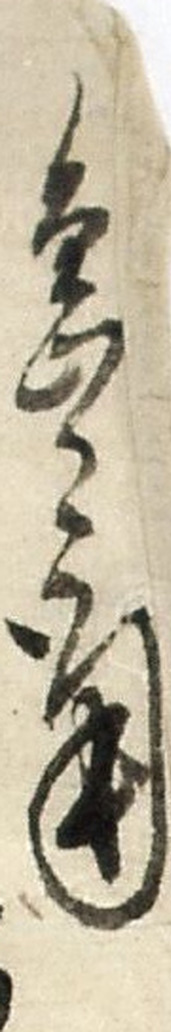急々御用
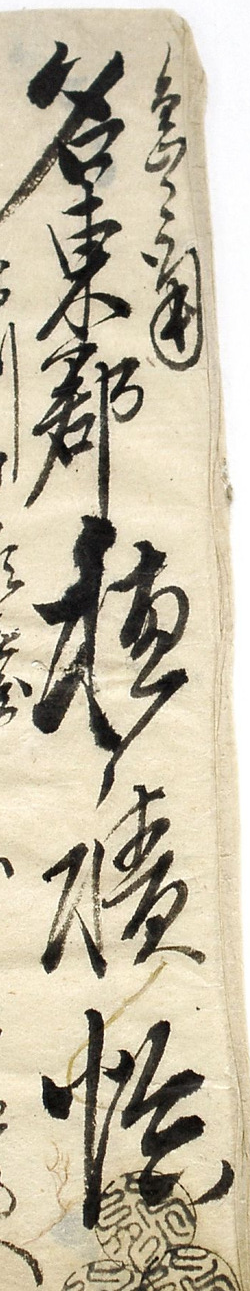名東郡穂積恰
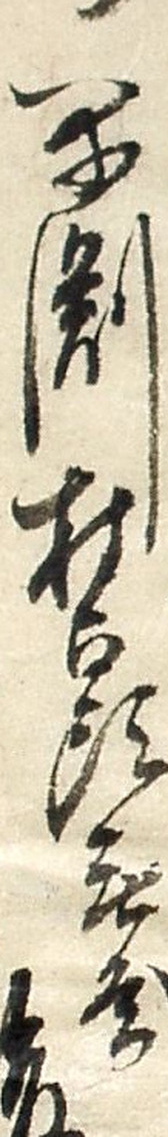早渕村与頭庄蔵
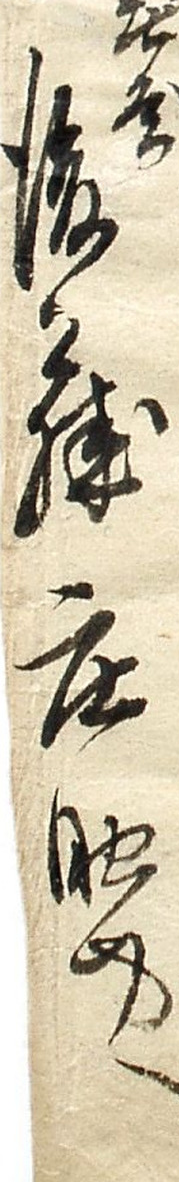後藤庄助方へ

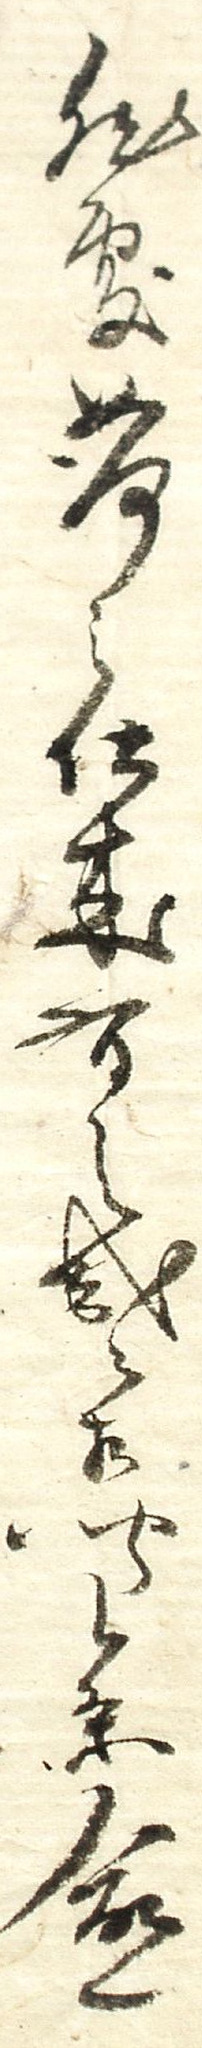然處如何之仕成有之哉ニ相聞候条愈
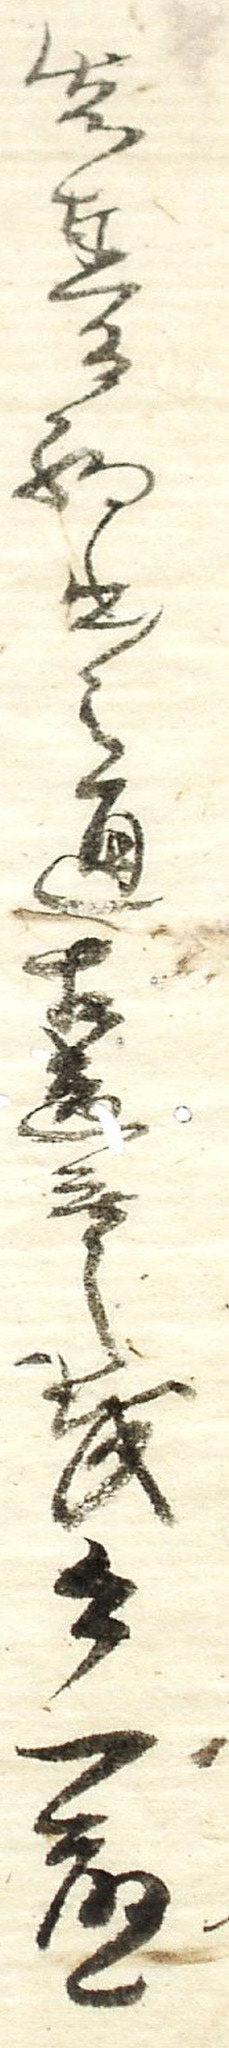先達而約書之通相違無之義今一應
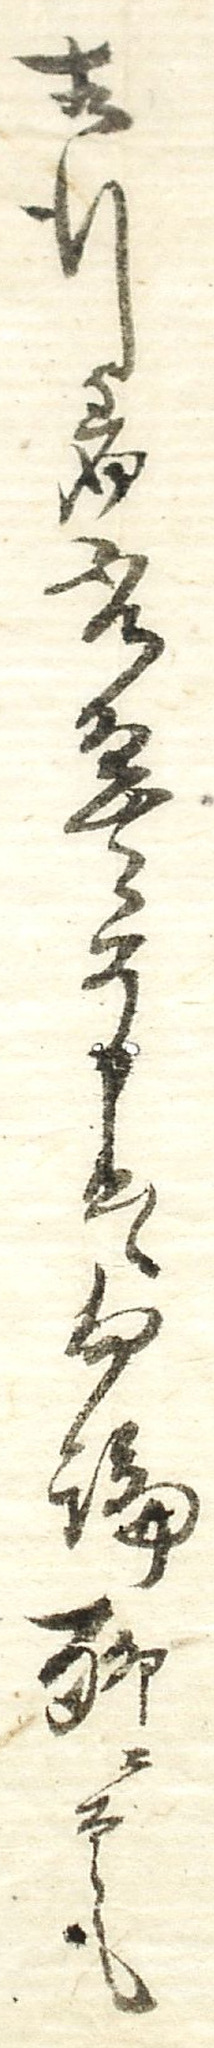相行着否急々可申出候勿論聊ニ而も
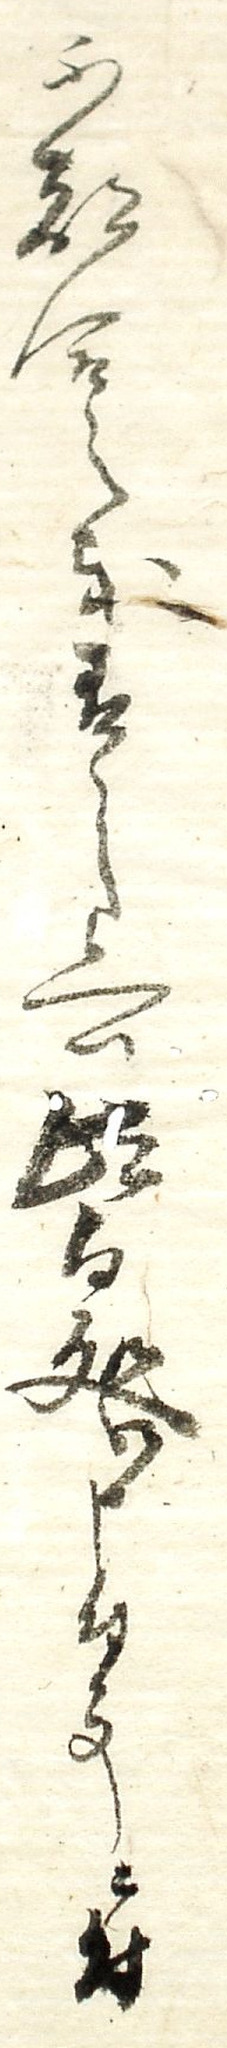不都合之義有之候へハ頓而咎申付事ニ付
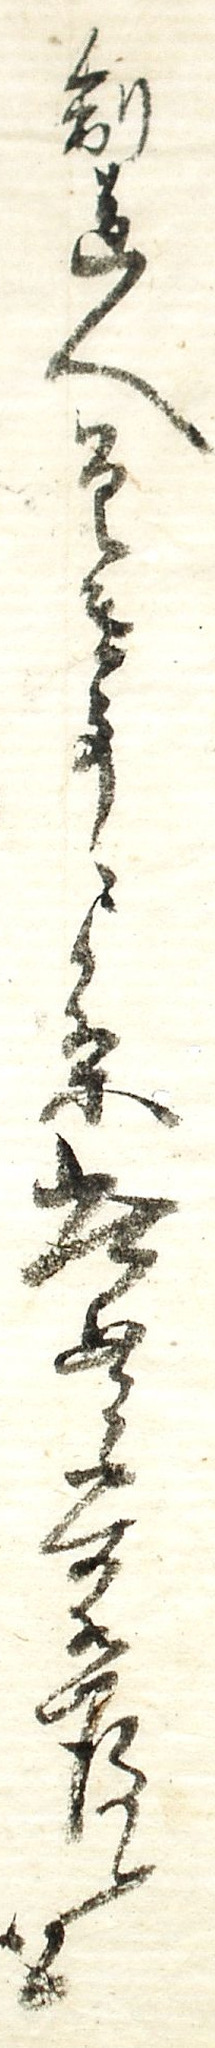制道人差遣候事ニ候条此段も可有存候以上
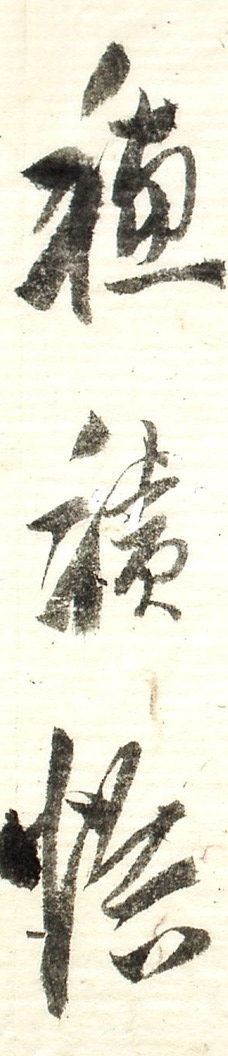穂積恰
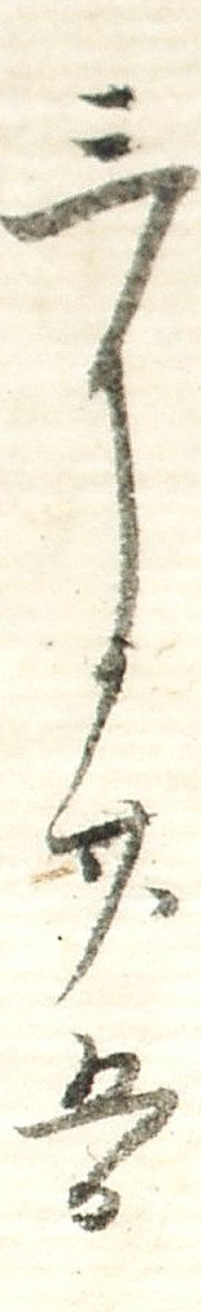三月廿五日
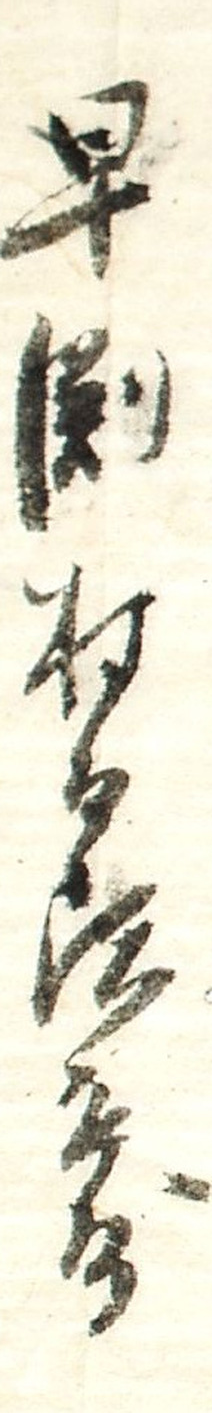早渕村与頭庄蔵
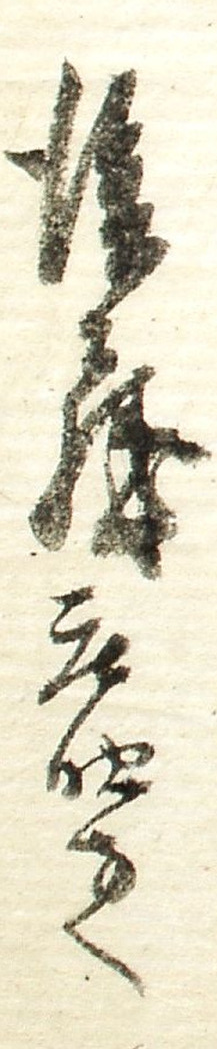後藤庄助方へ

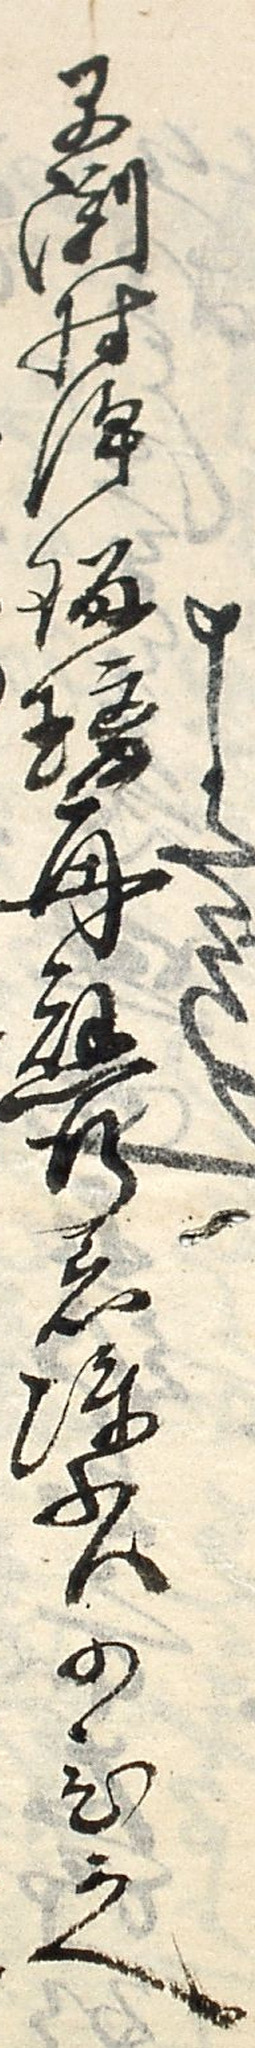早渕村浄瑠璃再應行着添書のひかへ
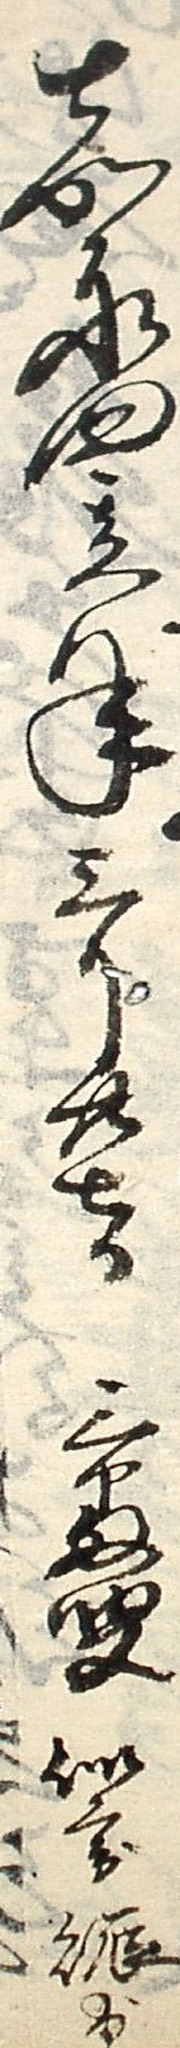嘉永四亥年三月廿七日三番叟似寄賑布

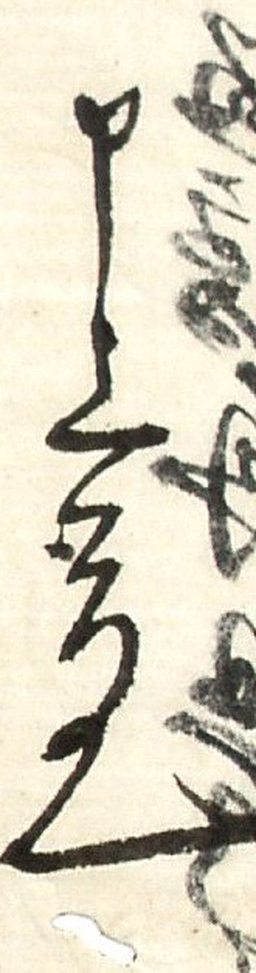申上覚
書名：早渕村福満寺浄瑠璃再応行着添書ひかへ
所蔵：鳴門教育大学 Naruto University of Education
